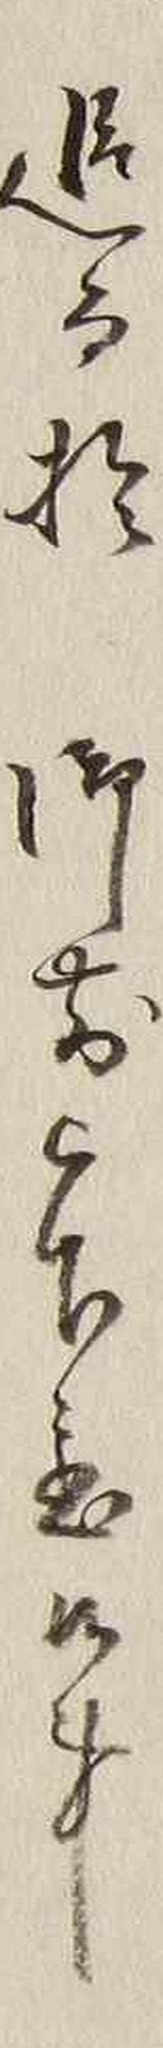追而於御前被下置候事
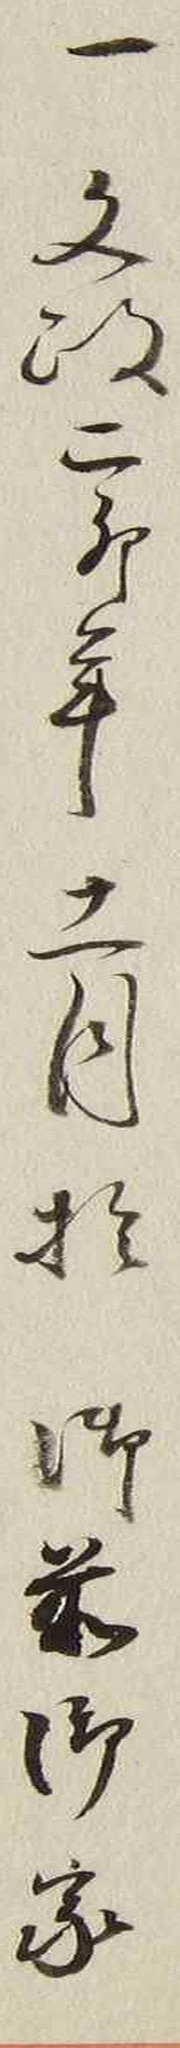一文政二卯年十一月於御前御家
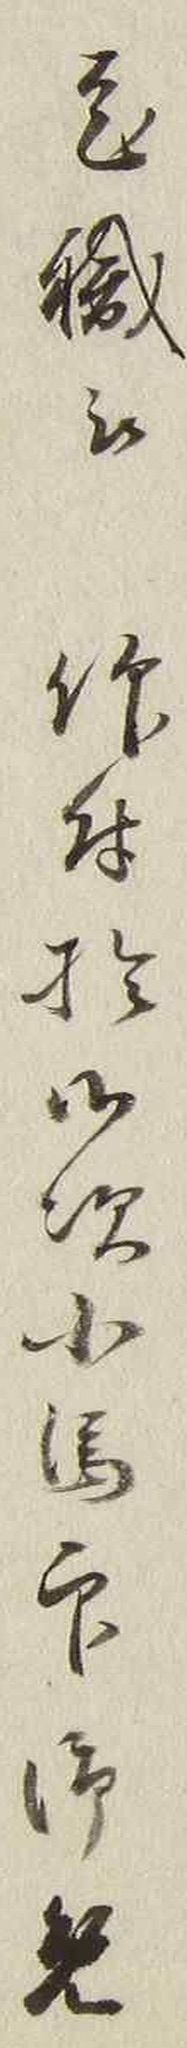老職被仰付於御次小馬印御免
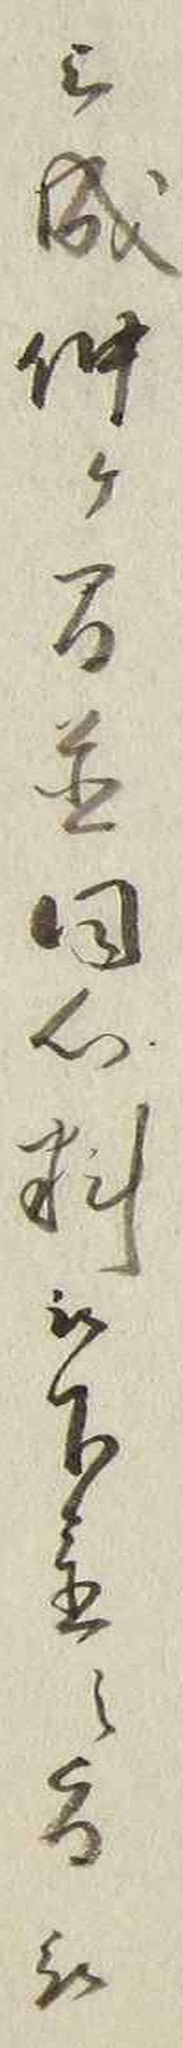被成仲ヶ間並同心料候被下置之旨被

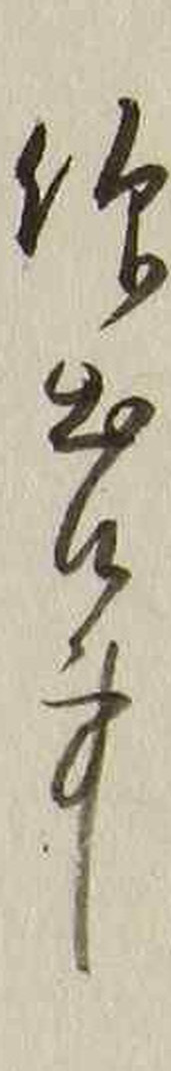作出候事
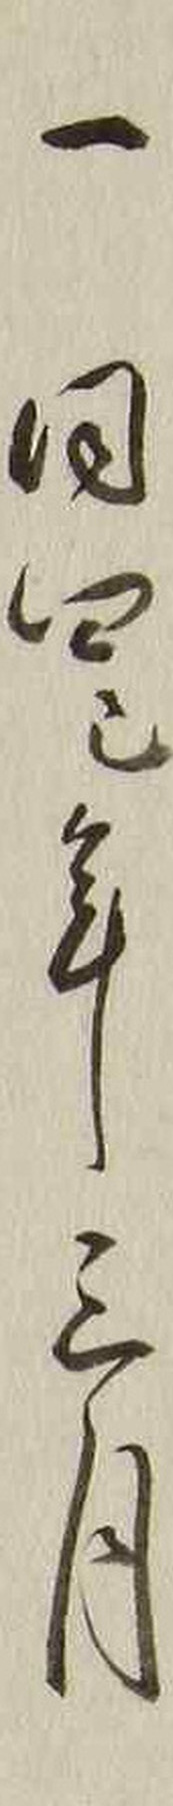一同四巳年三月
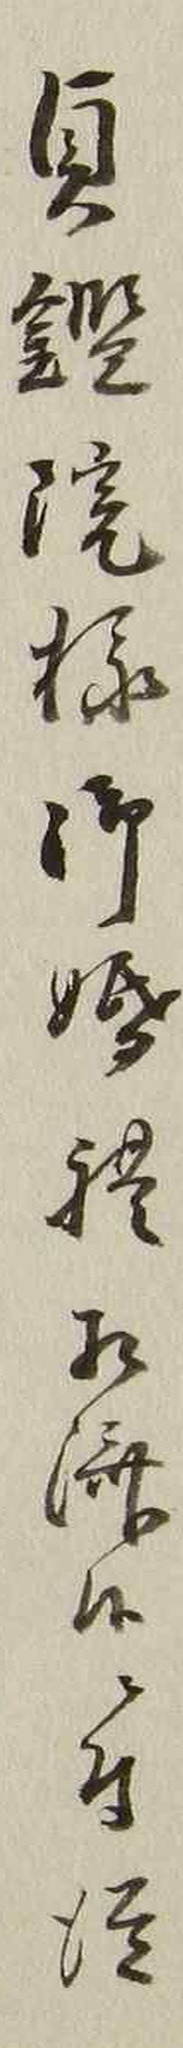貞鑑院様御婚礼相済候に付従
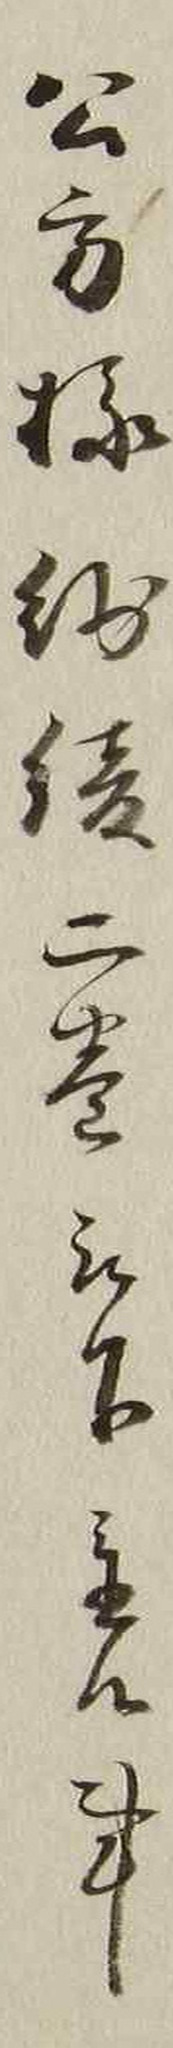公方様紗綾二巻被下置候事
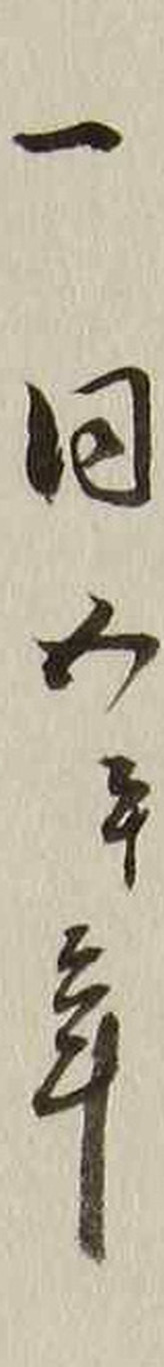一同五牛年
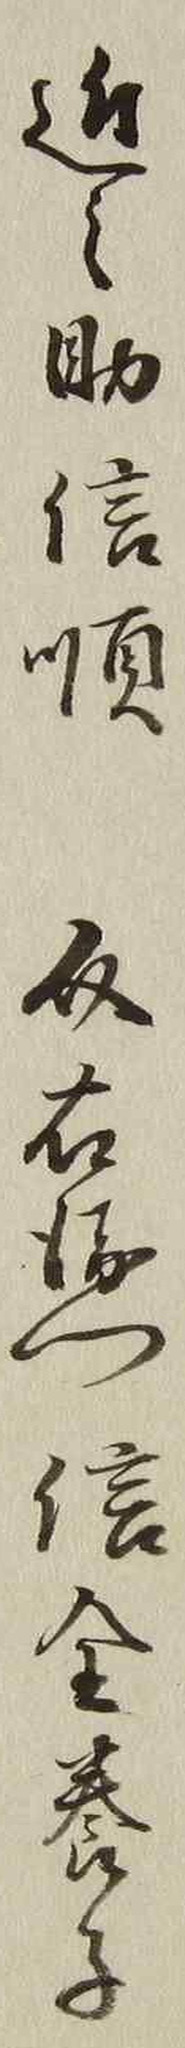近之助信順介右後門信全養子
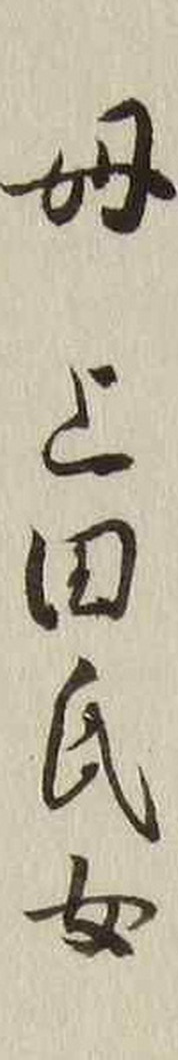母上田氏女
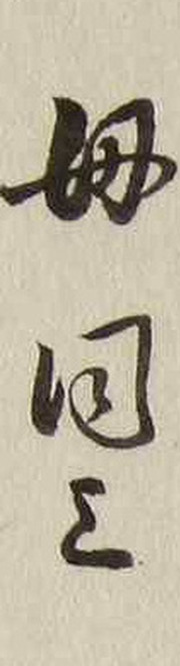母同上
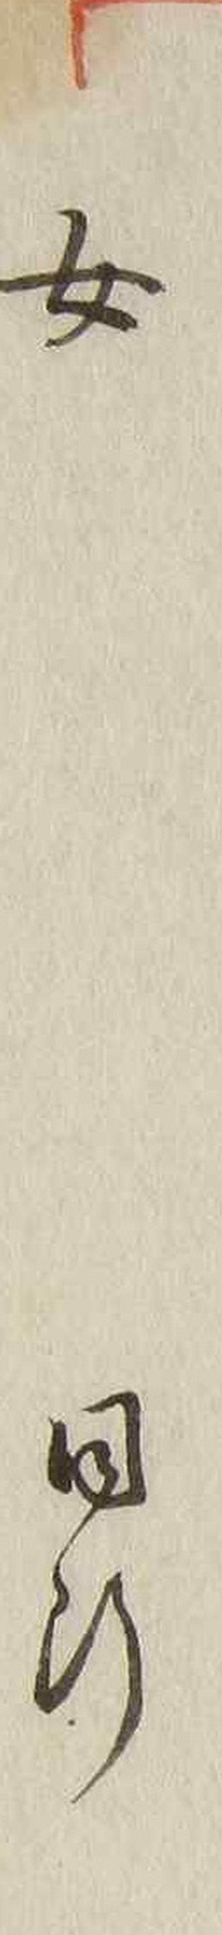女同断

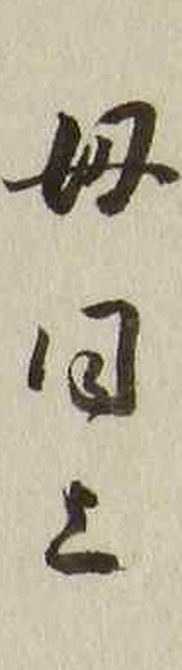母同上
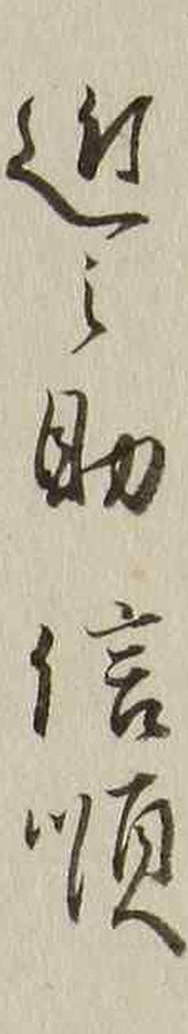近之助信順
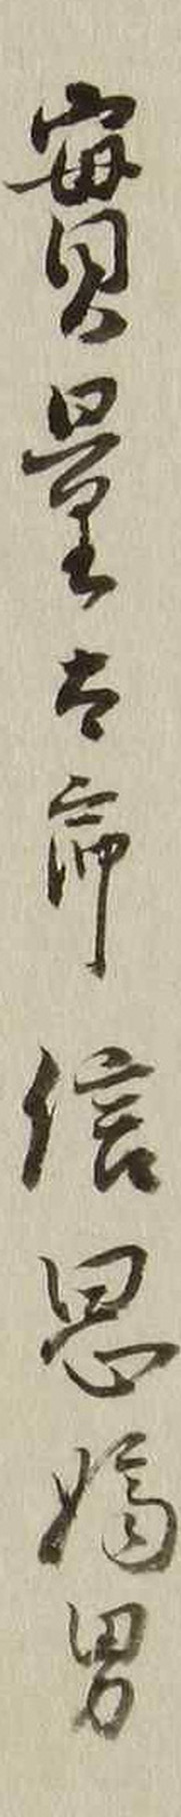実量太郎信思嫡男
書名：諸士系譜　巻之159　な之部1
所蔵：会津若松市立会津図書館
